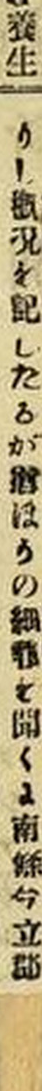りし概況を記したるが猶ほかの細報を聞くに南條今立郡
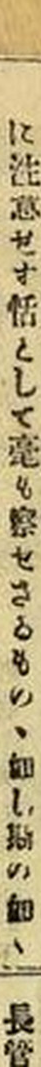に注意せす恬として毫も察せさるものゝ如し斯の如く
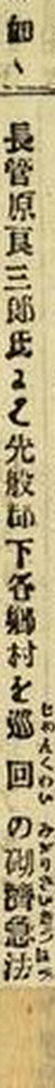長官原良三郎氏には先般郡下各郷村を巡回の砌済急法
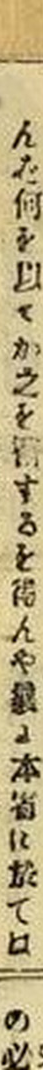んば何を以てか之をするを得んや曩に本省に於ては
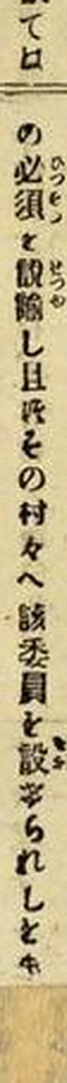の必須を説諭し且つその村々へ該委員を設けられしをも
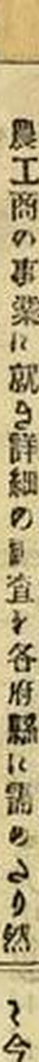農工商の事業に就き詳細の調査を各府県に需めたり然
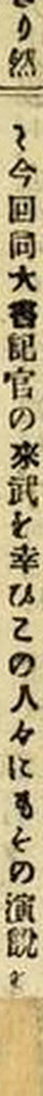て今回同大書記官の来武を幸ひこの人々にもその演説を
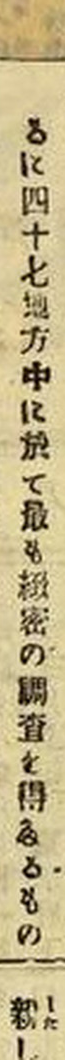るに四十七地方中に於て最も緻密の調査を得たるもの
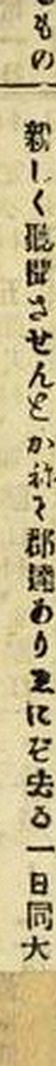親しく聴聞させんとかねて郡達ありしにぞ去る一日同大
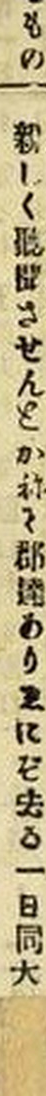親しく聴聞させんとかねて郡達ありしにぞ去る一日同大
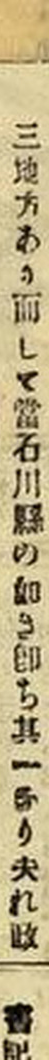三地方あり而して当石川県の如き即ち其一なり夫れ政
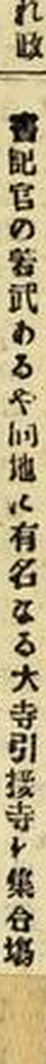書記官の若武あるや同地に有名なる大寺引接寺を集合場
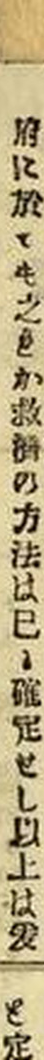府に於ても之れか救済の方法は已に確定せし以上は爰
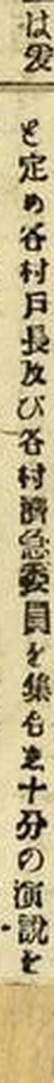と定め各村戸長及び各村済急委員を集合し十分の演説を
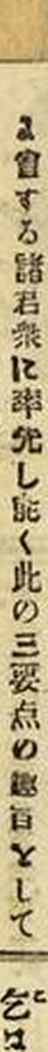に会する諸君衆に率先し能く此の三要点の趣旨をして
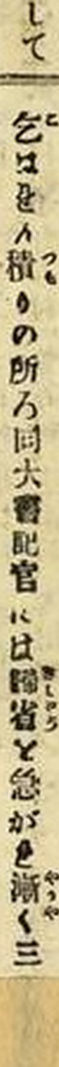乞はれん積りの所ろ同大書記官には帰省を急がれ漸く三
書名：温古集 五巻
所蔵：福井県文書館 Fukui Prefectural Archives
